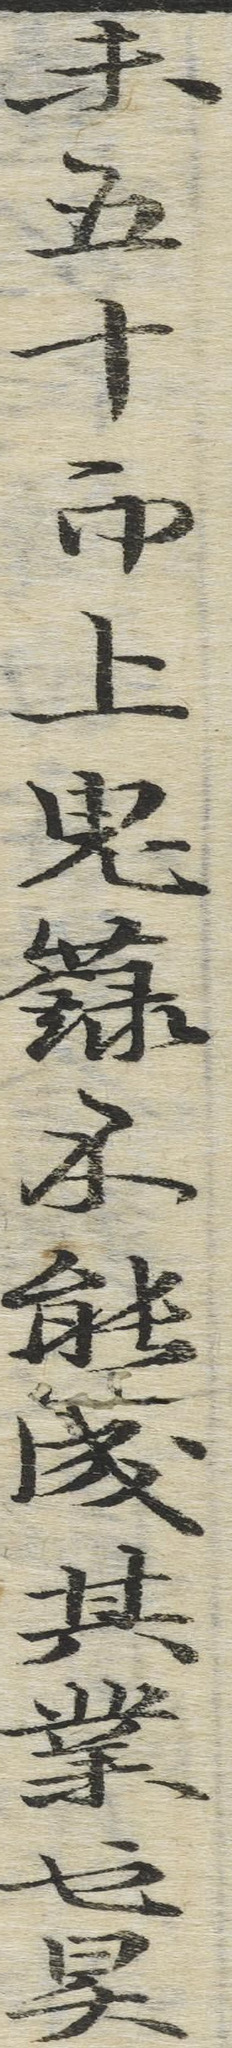未五十而上鬼籙不能成其業也昊
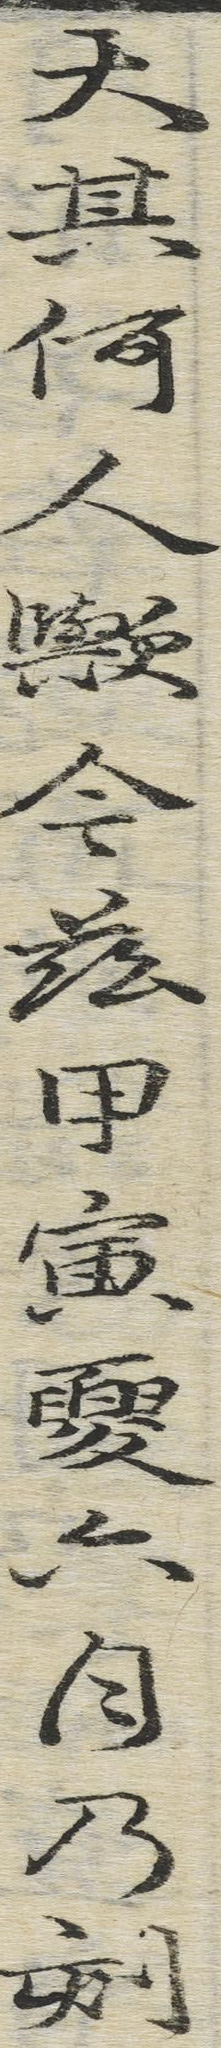天其何人歟今茲甲寅夏六月乃刻
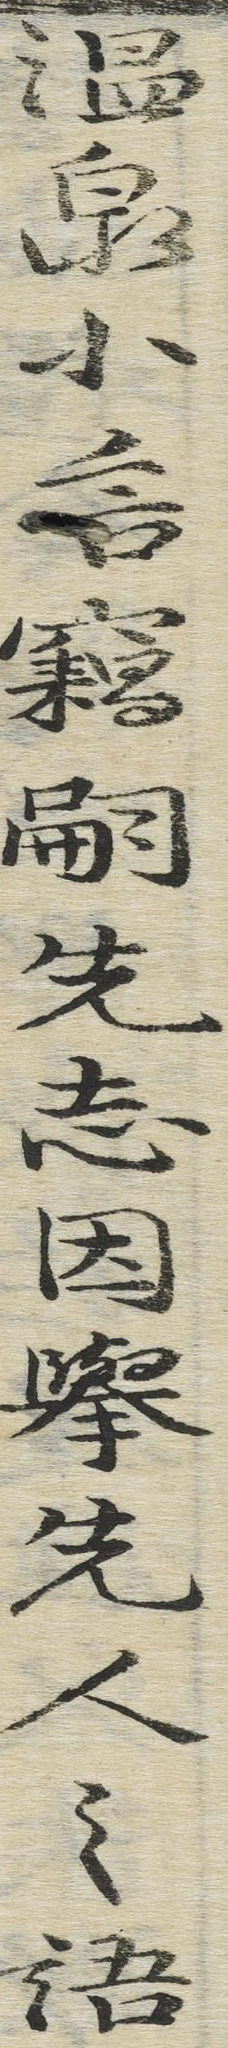温泉小言窃嗣先志因挙先人之語
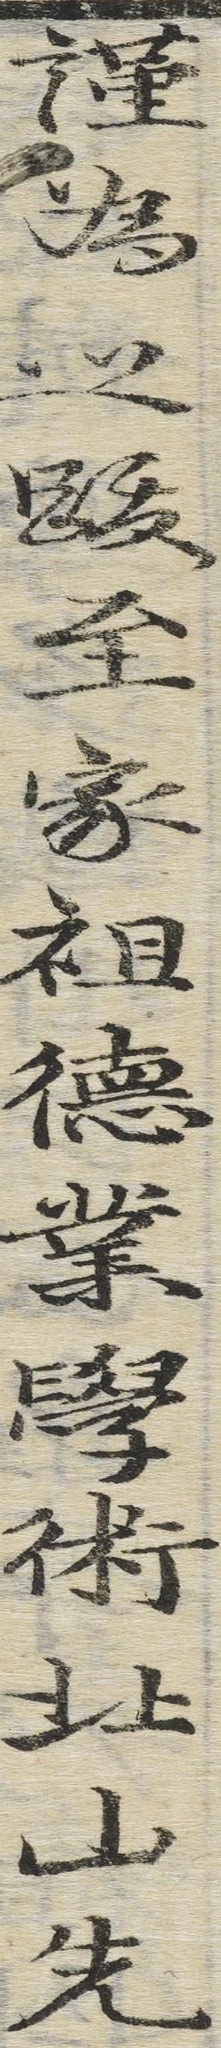謹為以跋至家祖徳業学術北山先
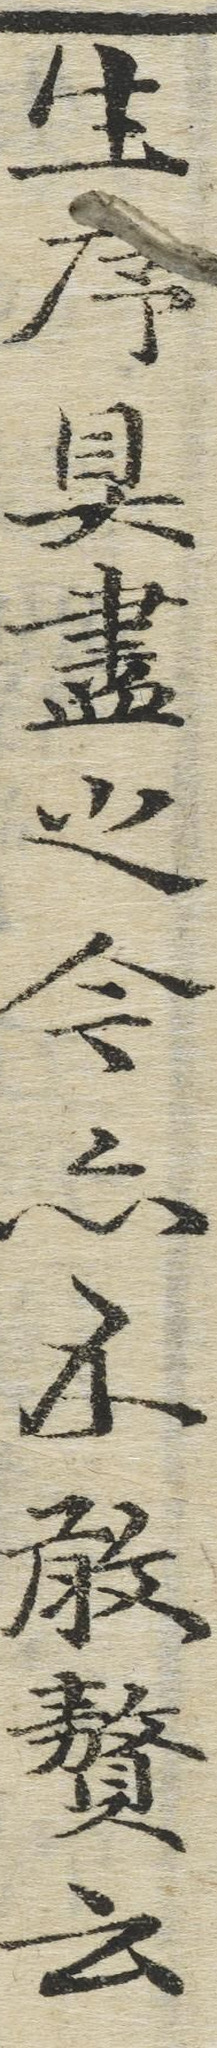生序具尽之今亦不敢贅云
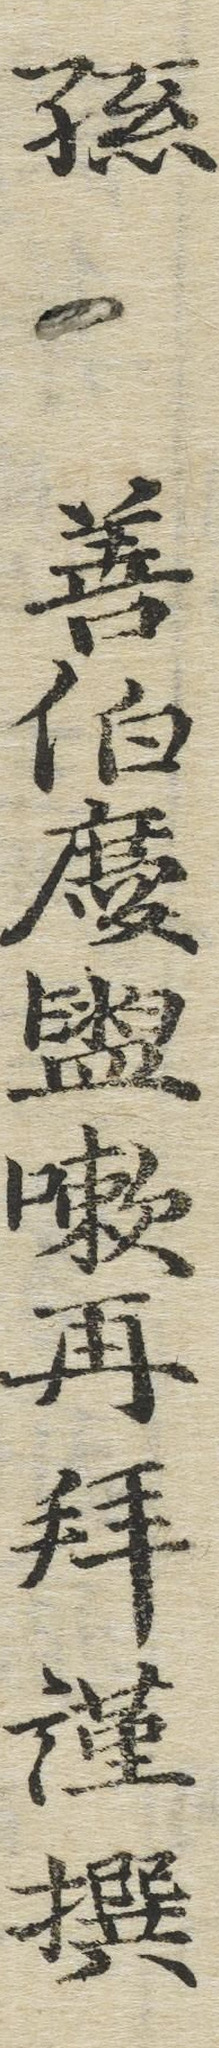孫善伯慶盥嗽再拜謹撰
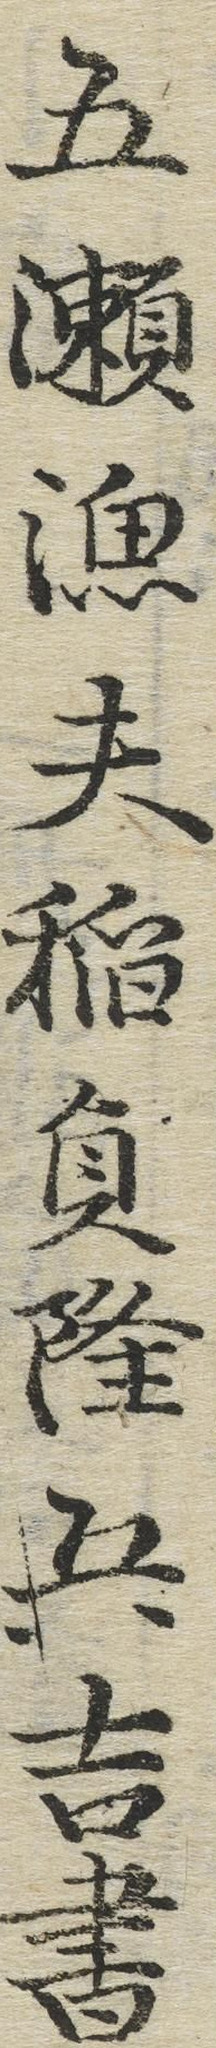五瀬漁夫稲貞隆兵吉書

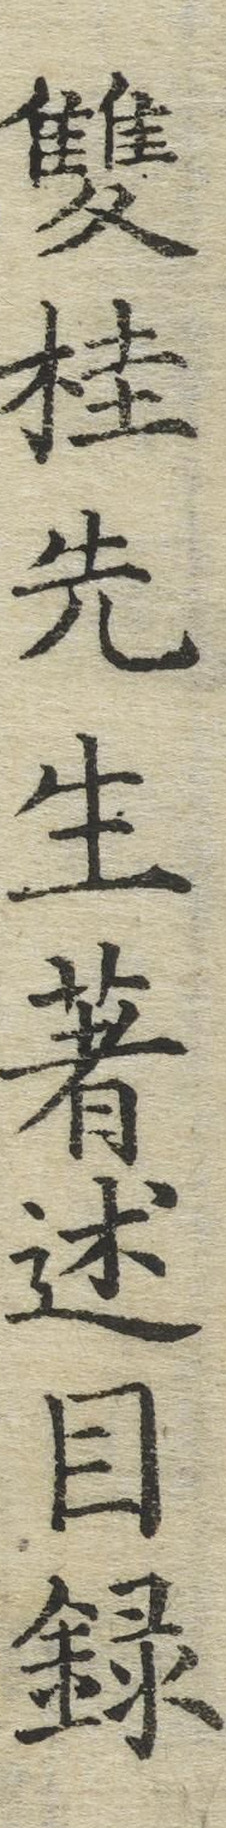双桂先生著述目録
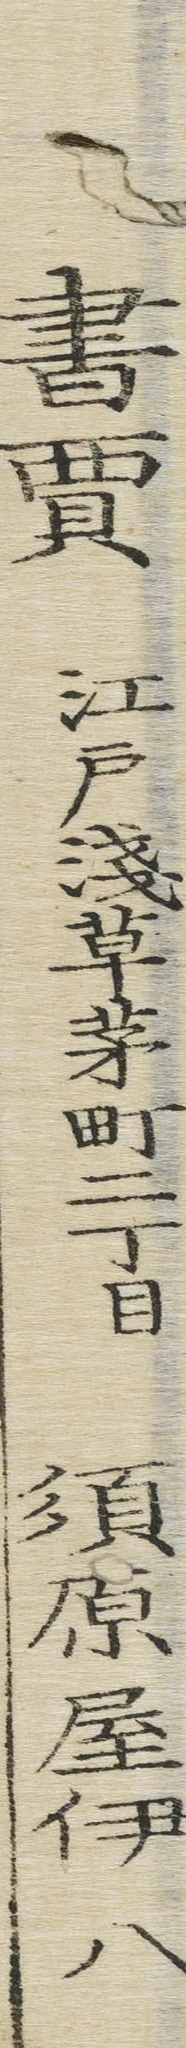書賈江戸浅草茅町二丁目須原屋伊八
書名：温泉考
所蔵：東京大学地震研究所図書室 Earthquake Research Institute Library, The University of Tokyo, JAPAN
